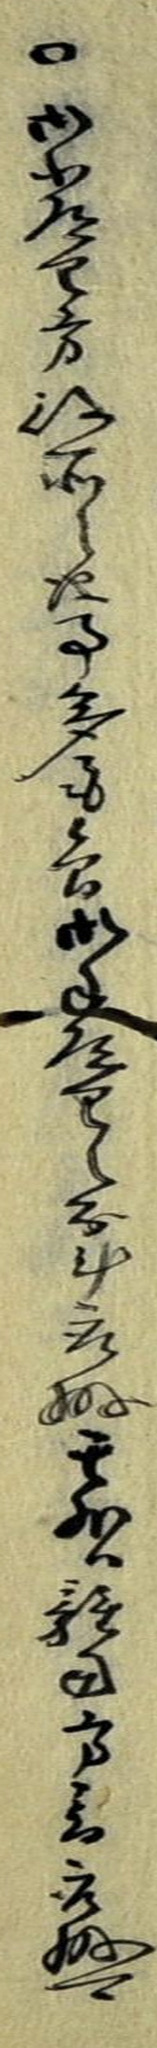〇御小道具方役所之儀事多にも候間御手道具之分斗取扱其外は雑用方に而取扱可

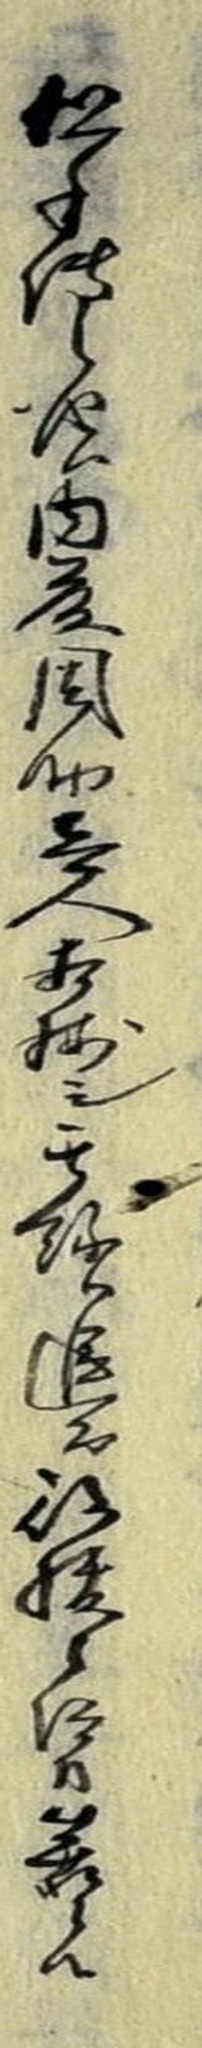但手伝之儀は内藤周助壱人相残し其余は追而役援被仰付筈に候
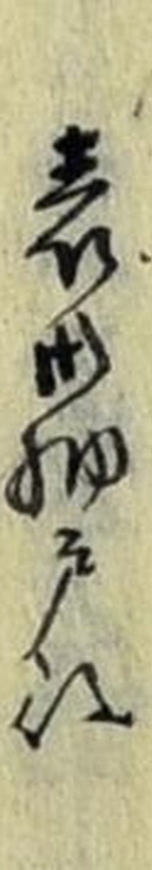表御納戸役
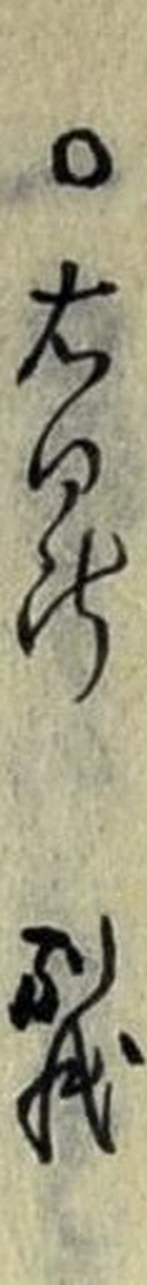〇右同断別紙
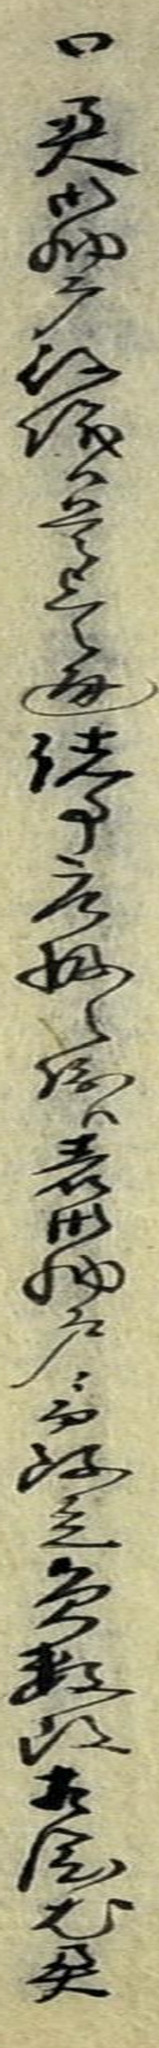〇奥御納戸役儀は是迄之通諸事取扱之儀は表御納戸に而致立員数改相渡尤奥
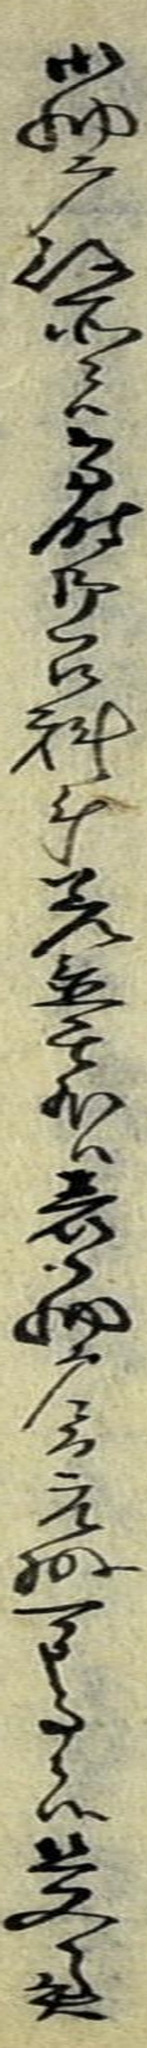御納戸役所には当時御召料斗差置其外は表御納戸に而取扱可申事に候且又奥
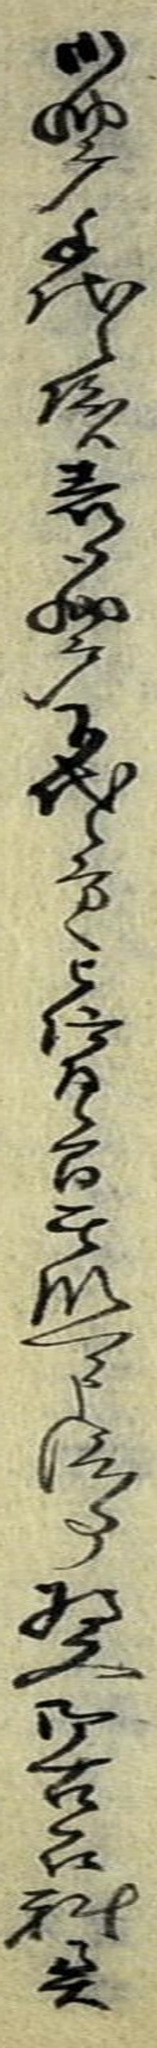御納戸手代之儀は表御納戸下代之方へ被仰付候間其段可申渡事将又御古召料奥
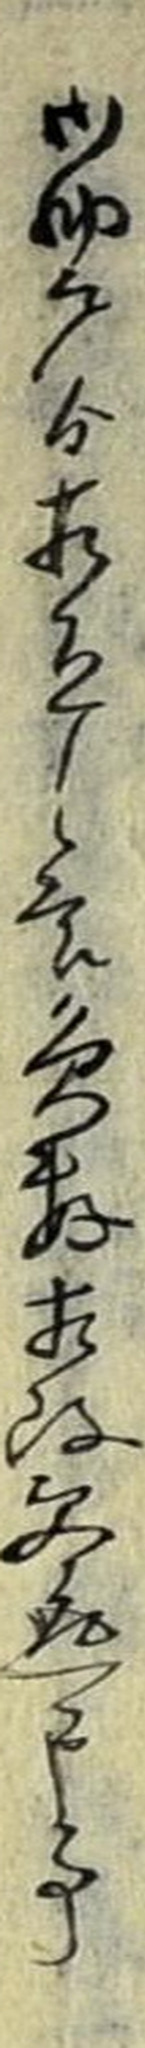御納戸ゟ相下け候節員数相改受取可申事
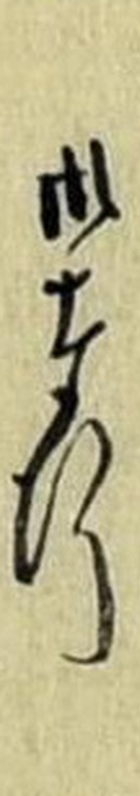御奉行
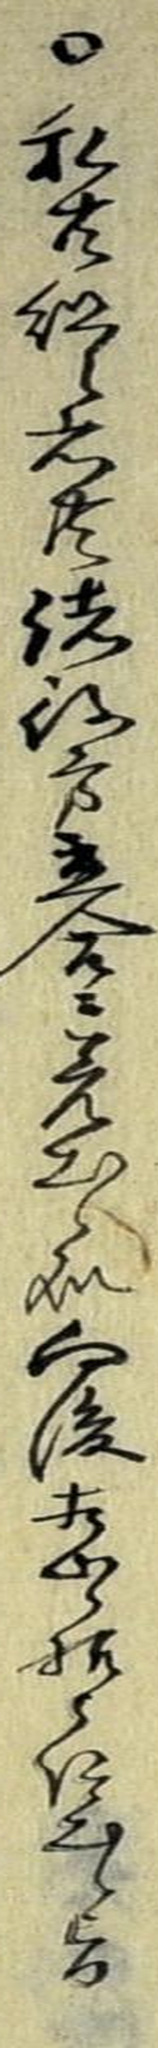〇私共組之者共諸役方立合に差出候処向後相止候様被仰出候旨
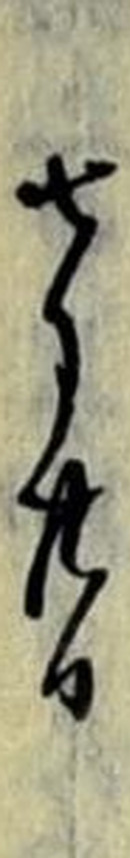七月廿日
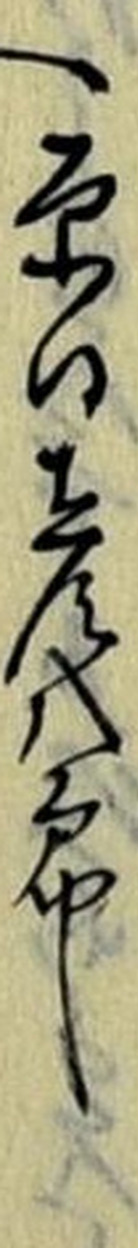原田彦八郎
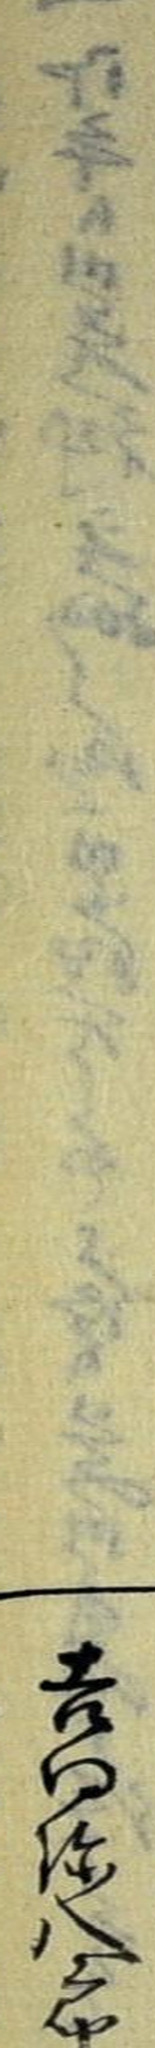吉田弥八郎
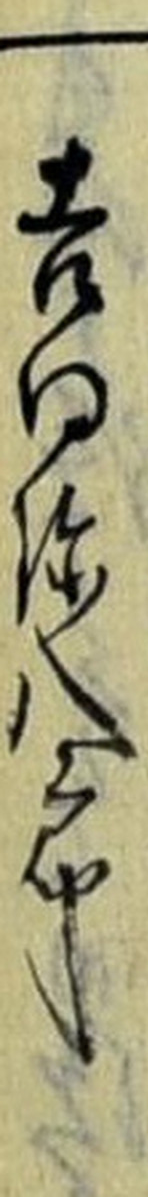吉田弥八郎
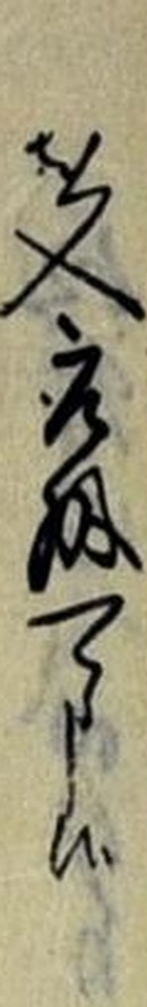を入取扱可申候
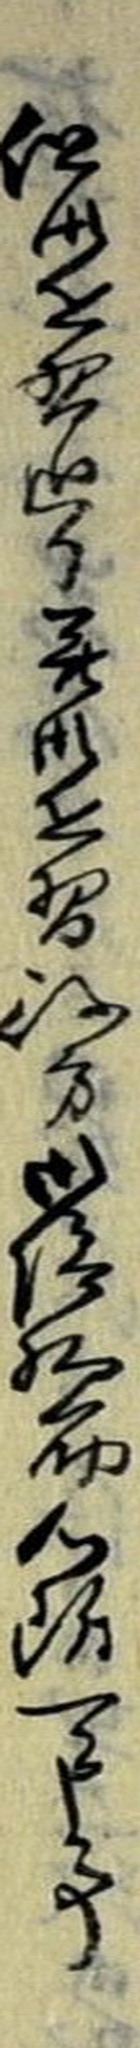但御近習廻り并御近習役方御倹約筋心附可申事
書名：命令之部 二
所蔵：福井県文書館 Fukui Prefectural Archives
